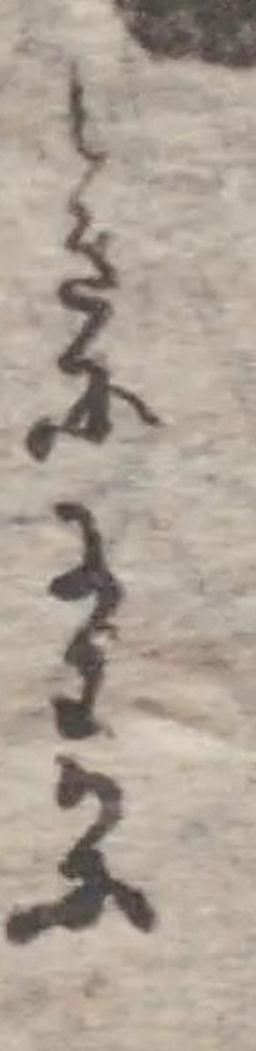ときににわかに
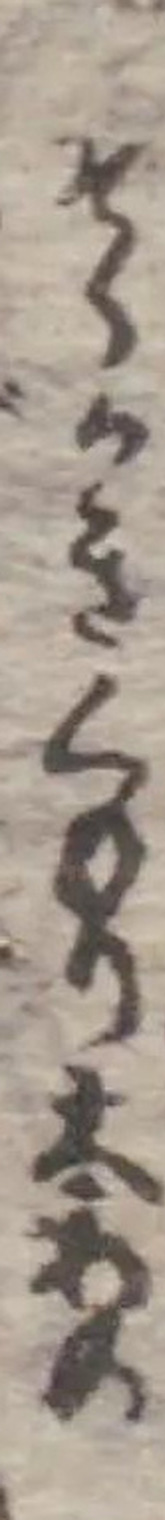そらかきくもり大あめ
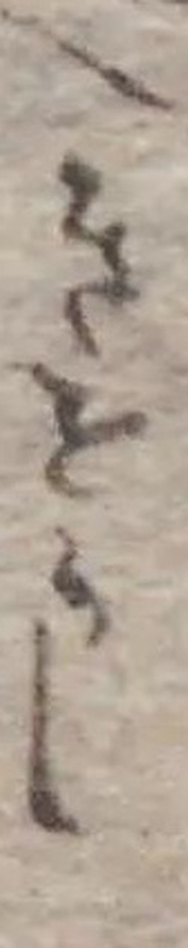きをうし
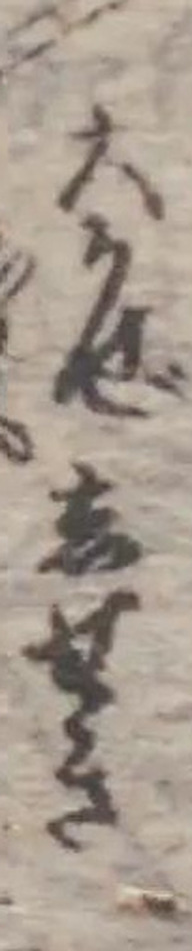大かぜしせき
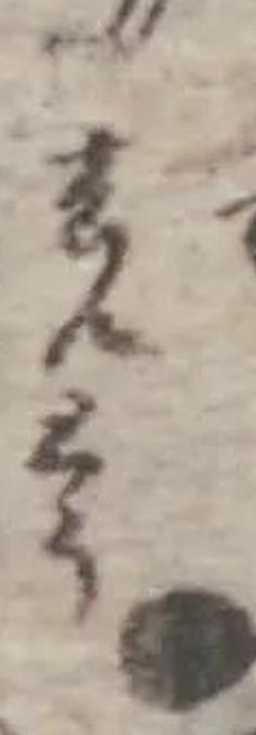しんとう
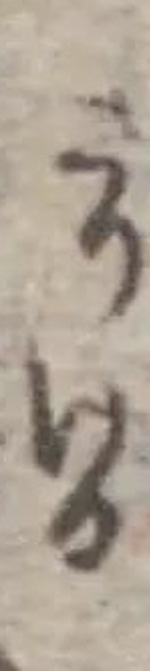さりける
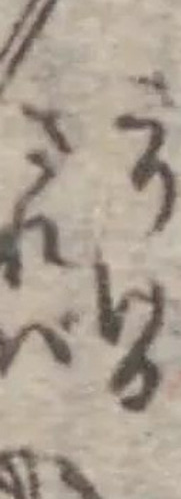されば
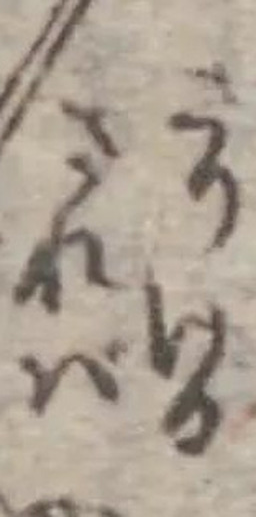されば
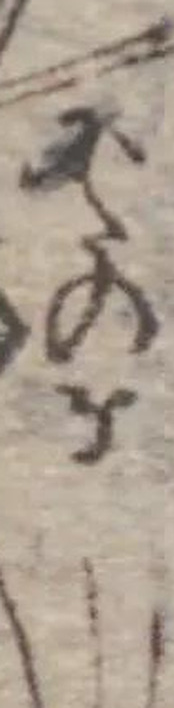にたのま
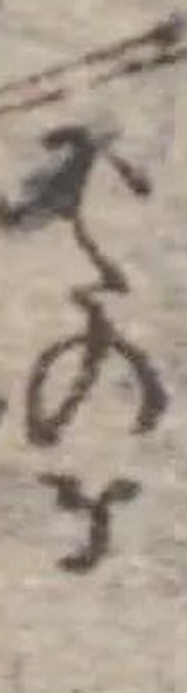にたのま
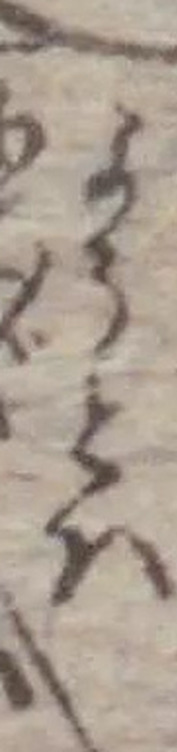ようとは
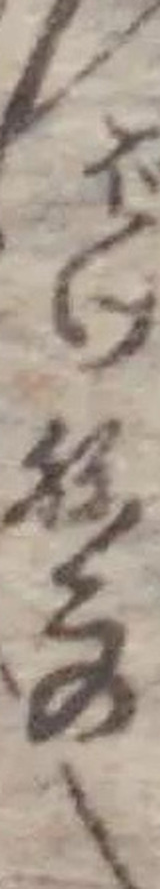ばけねこの
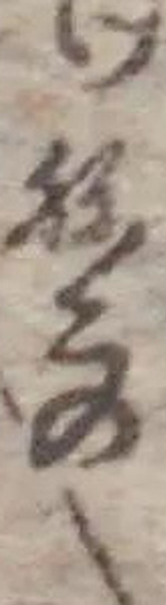ねこの
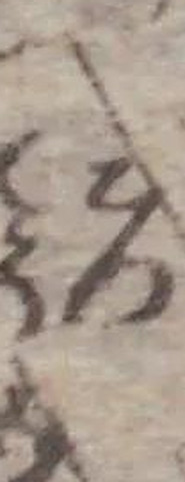てうめ
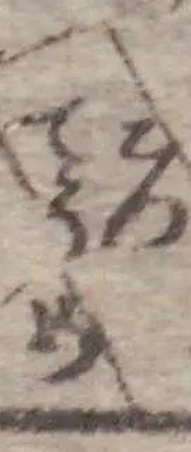てうめ
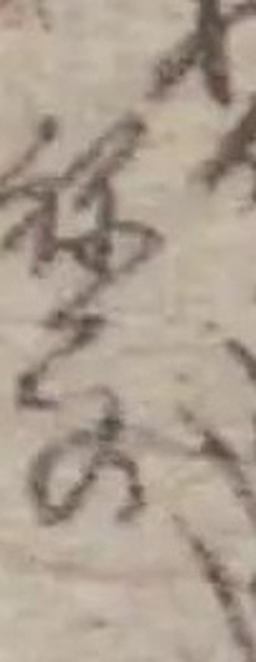ねこの
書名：鎌田又八 2巻
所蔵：国立国会図書館 National Diet Library, JAPAN
